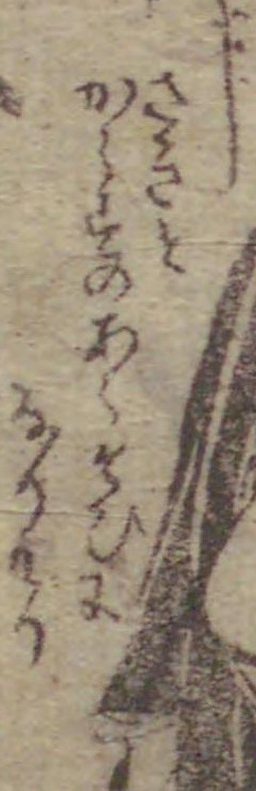からすのあらそひに
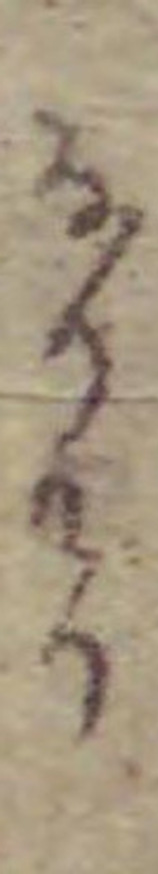なりけり

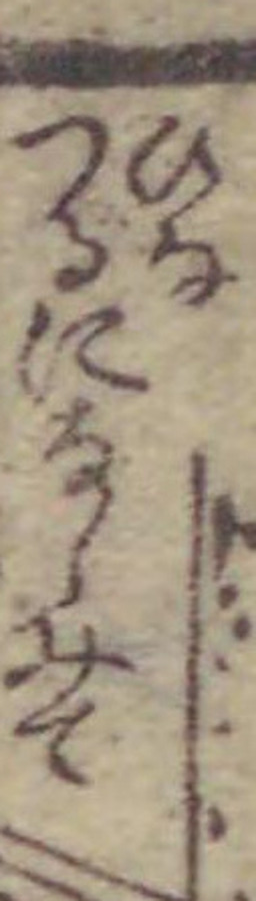つるになしみて
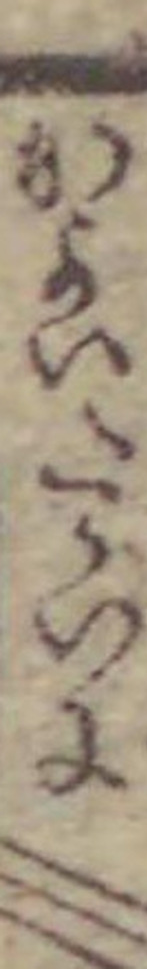かよいたかいに
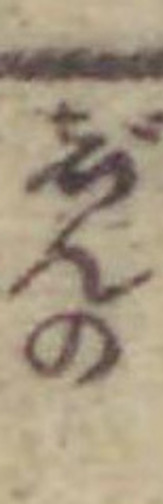ばんの
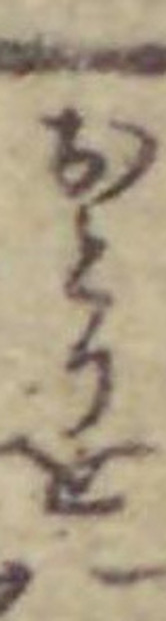おとりて
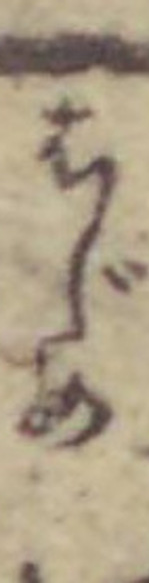はじめ
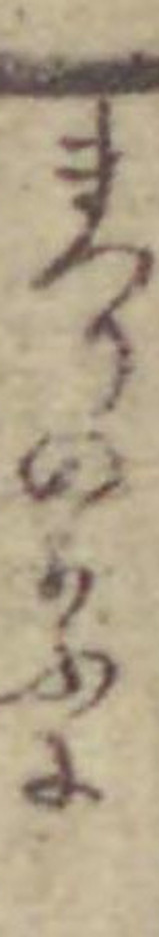まつりのよふに
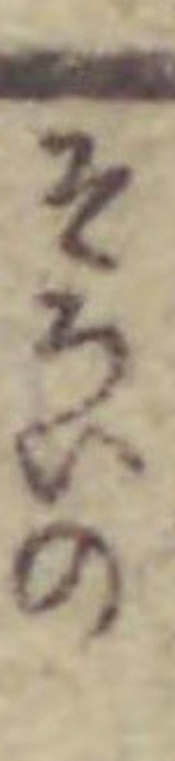そろいの
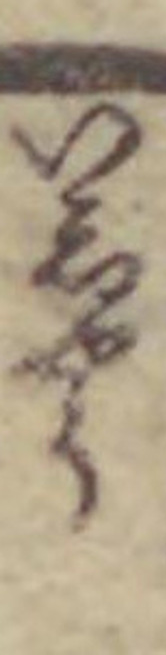いしやう
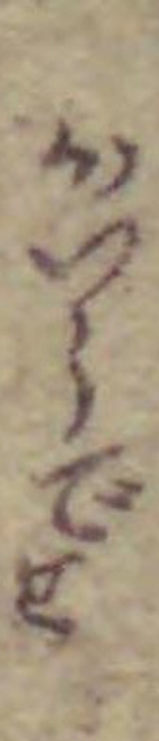かハらでせ
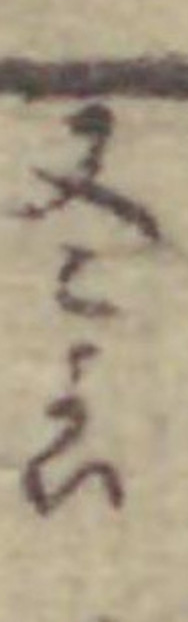又こよい
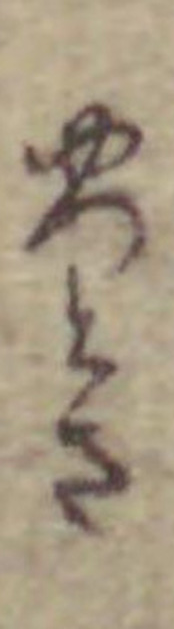やつとさ
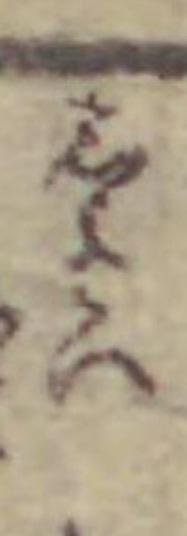しよかい
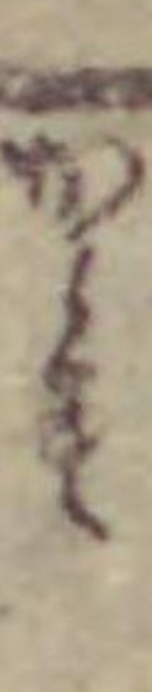からす
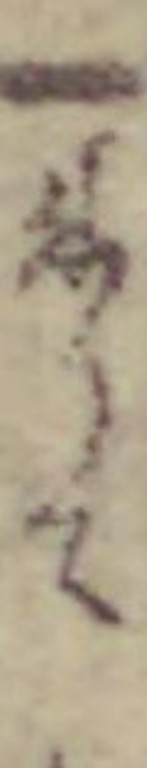来りて
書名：烏行水諺草 3巻
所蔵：国立国会図書館 National Diet Library, JAPAN
